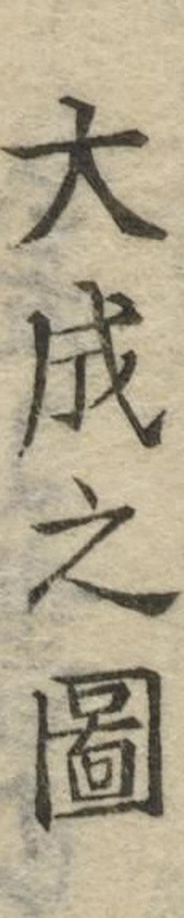大成之図
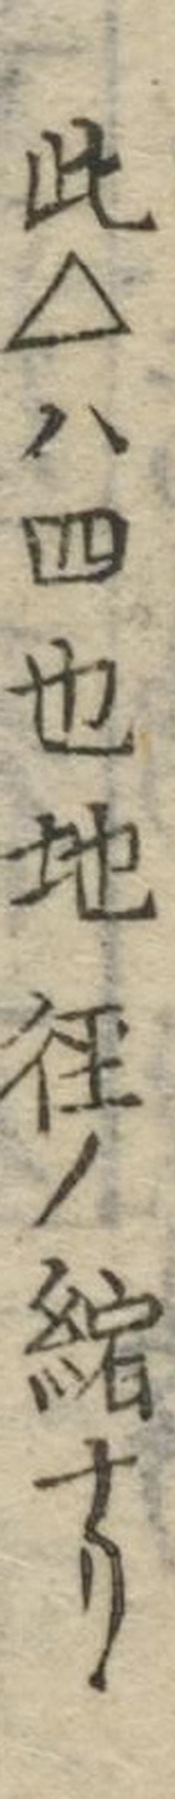此△ハ四也地径ノ縮ナリ
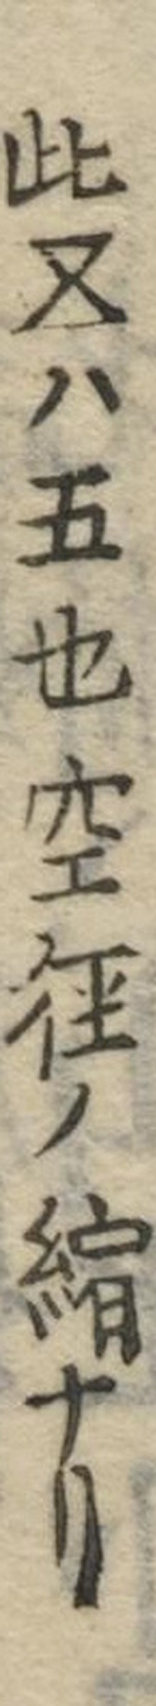此▽△ハ五也空径ノ縮ナリ
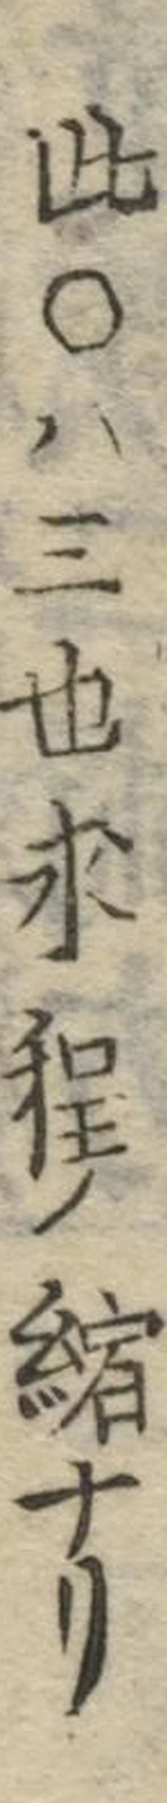此○ハ三也求程ノ縮ナリ
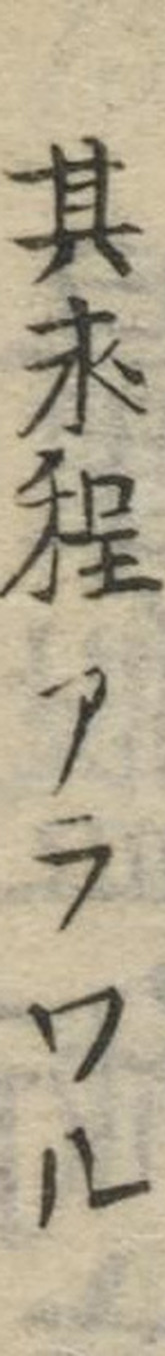其求程アラワル

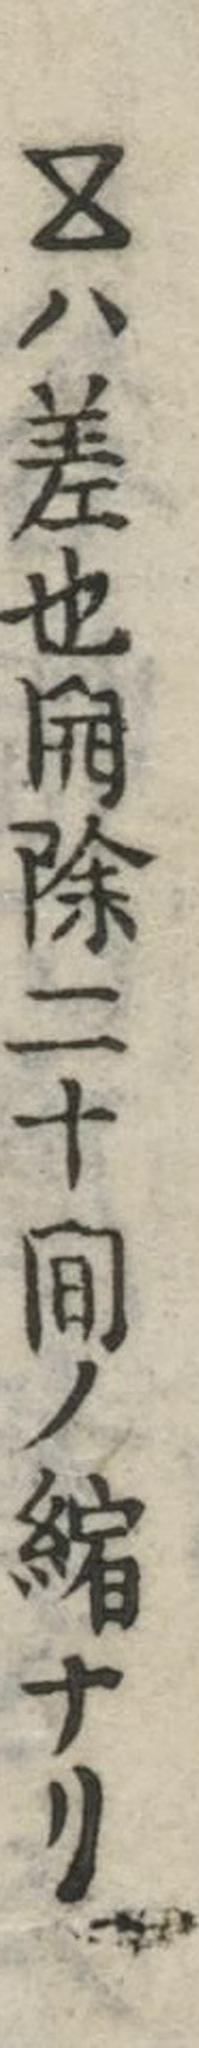▽△ハ差也開除二十間ノ縮ナリ
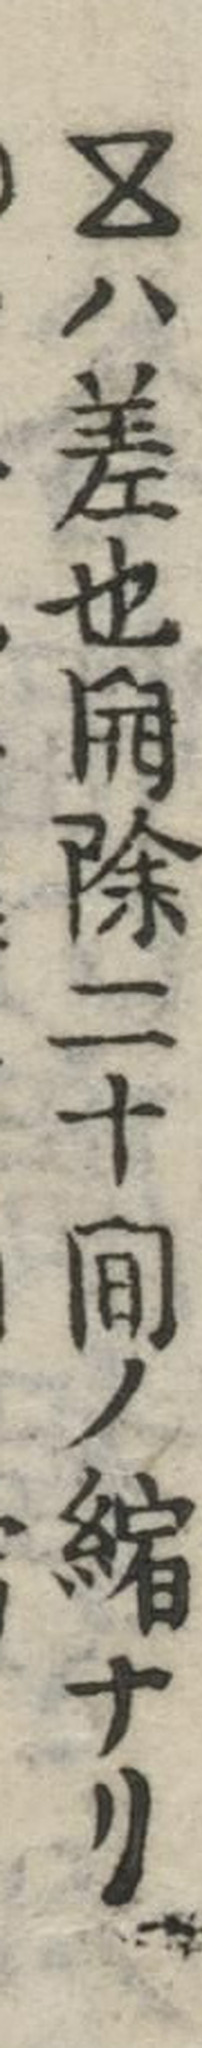▽△ハ差也開除二十間ノ縮ナリ
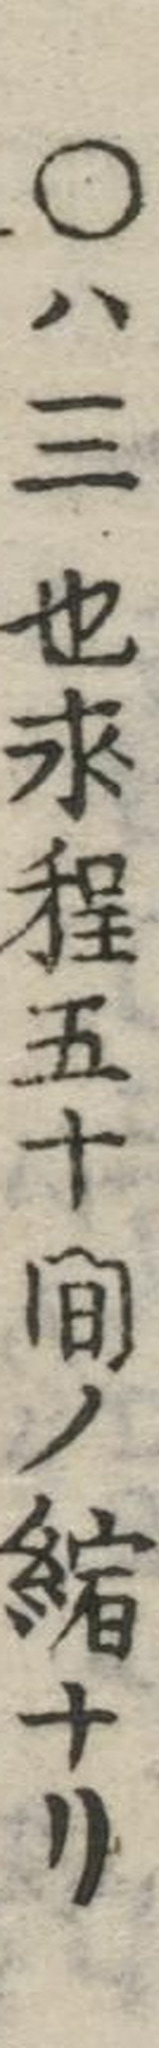○ハ三也求程五十間ノ縮ナリ
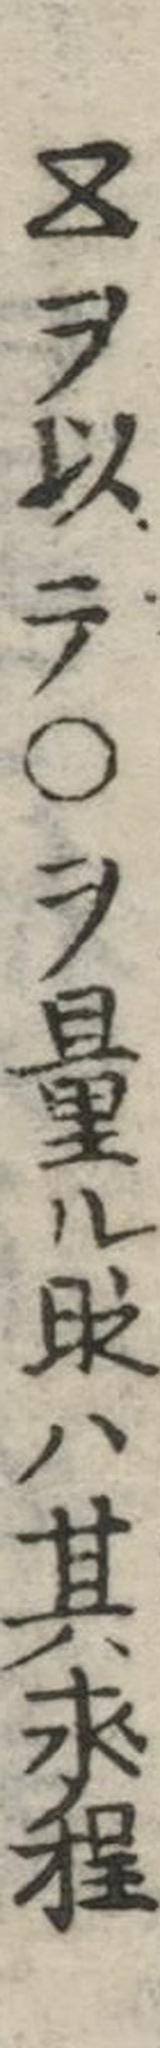▽△ヲ以テ○ヲ量ル時？ハ其求程
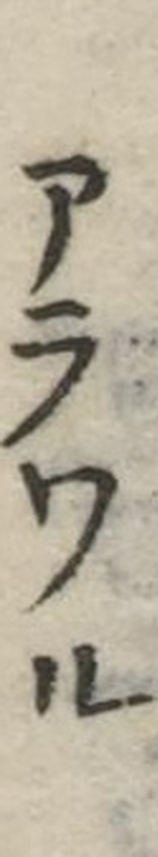アラワル
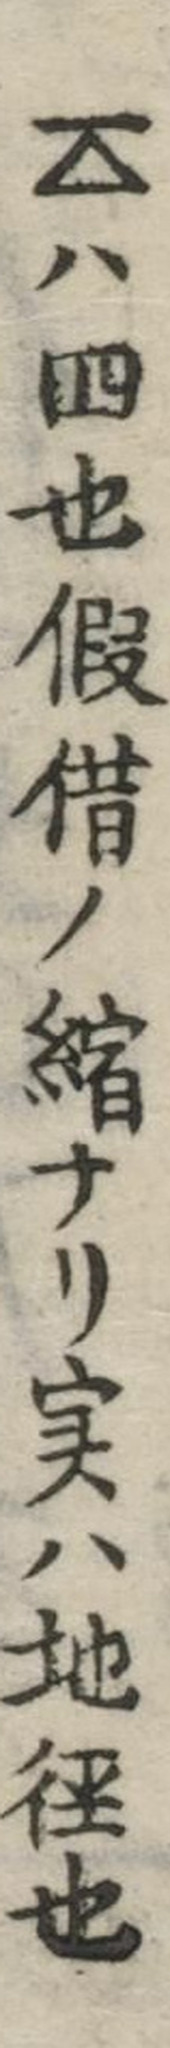△ハ四也仮借ノ縮ナリ実ハ地径也
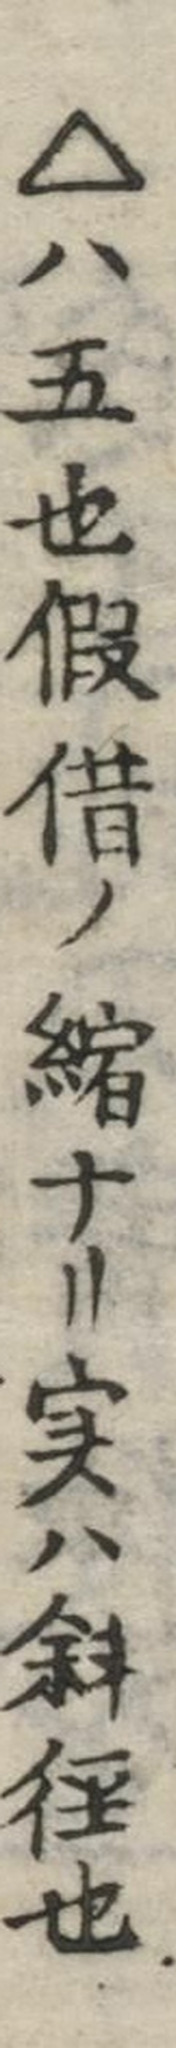△ハ五也仮借ノ縮ナリ実ハ斜径也
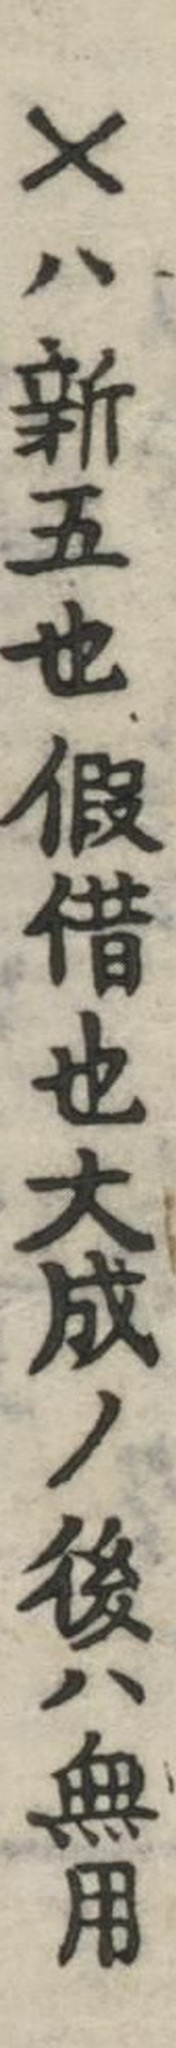✕ハ新五也仮借也大成ノ後ハ無用
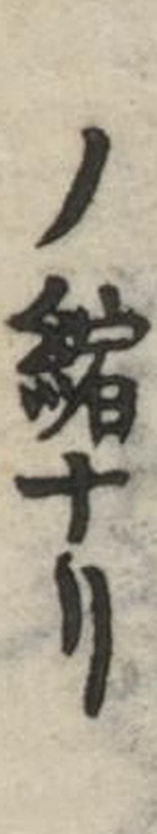ノ縮ナリ

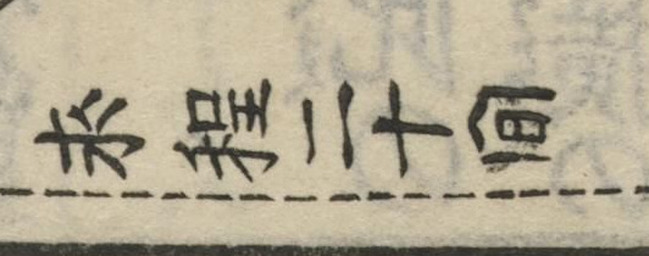求程二十間
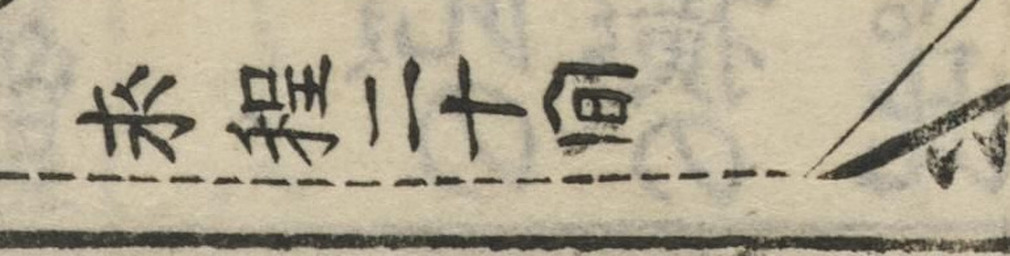求程二十間
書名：量地指南　巻之三（内題）
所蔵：東京大学地震研究所図書室 Earthquake Research Institute Library, The University of Tokyo, JAPAN
